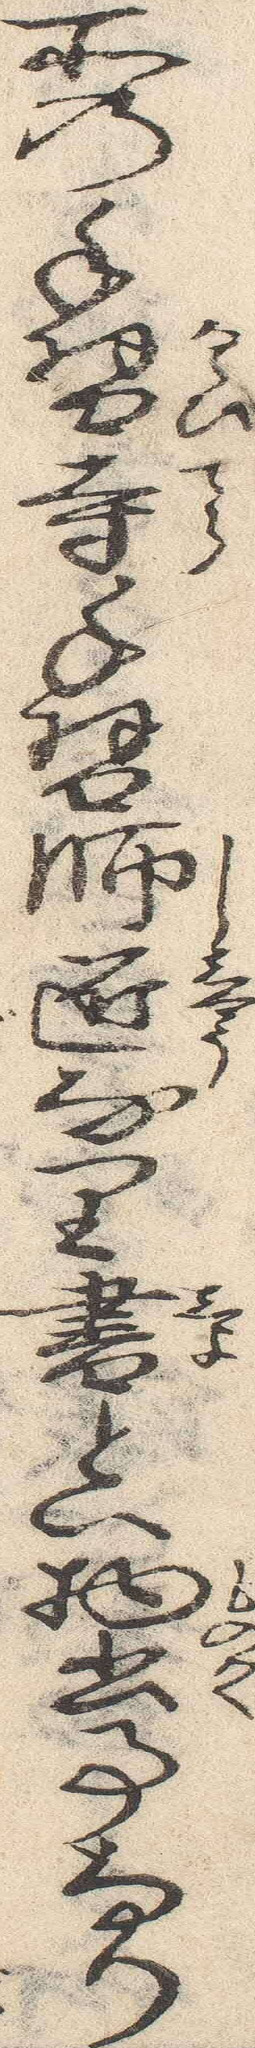所の手習寺手習師匠なり書とは物書事なり
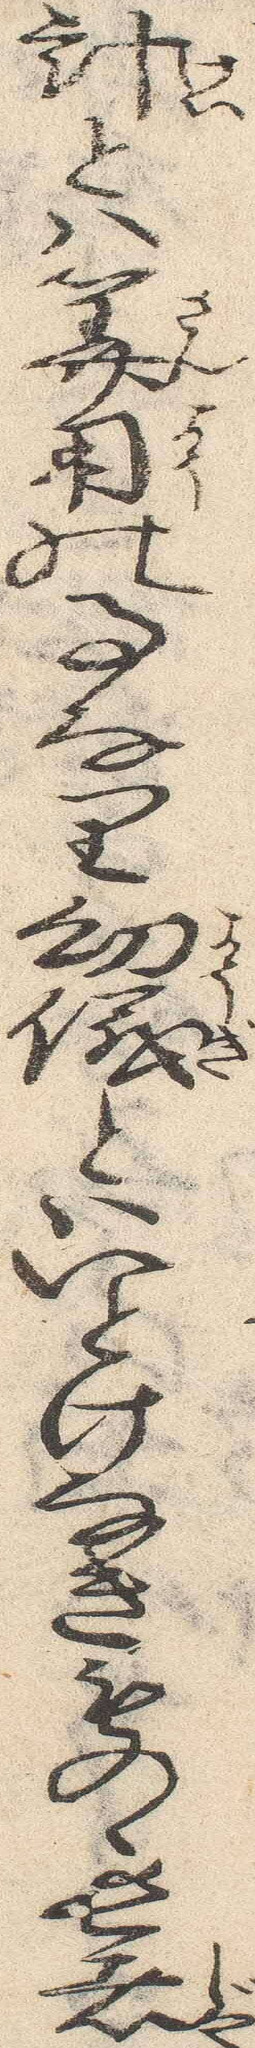計とは算用の事なり幼儀とはいとけなきものゝ長者
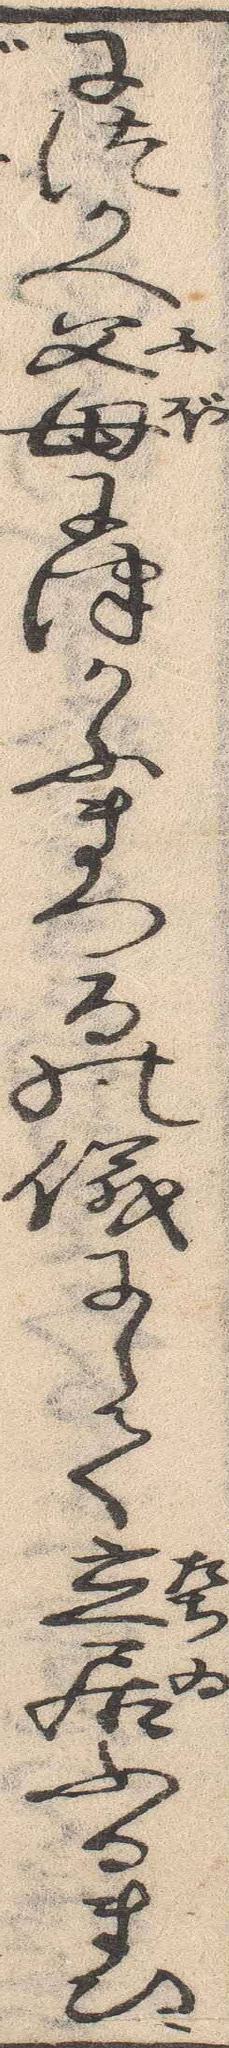につかへ父母につかふまつるの儀にして立居ふるまひ
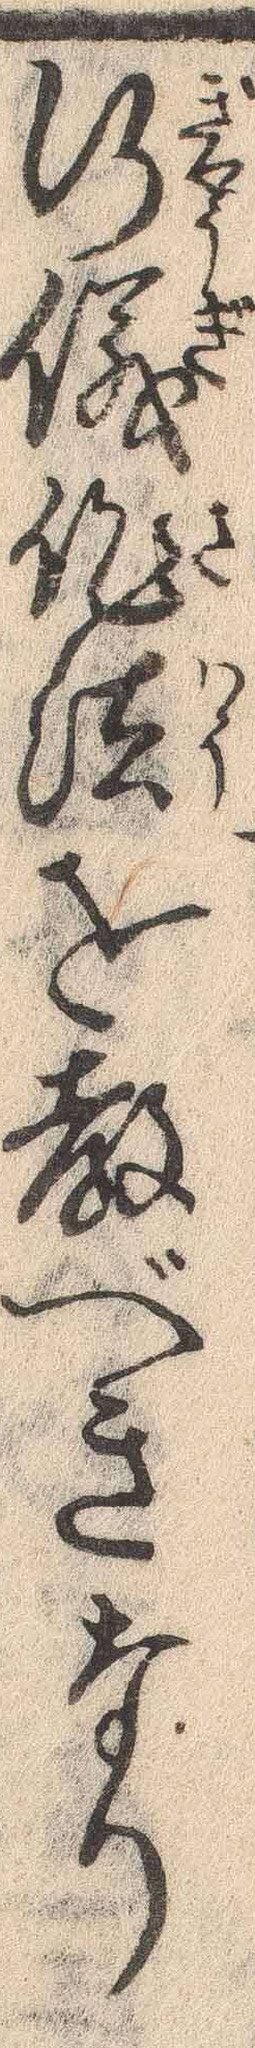行儀作法を教べきなり
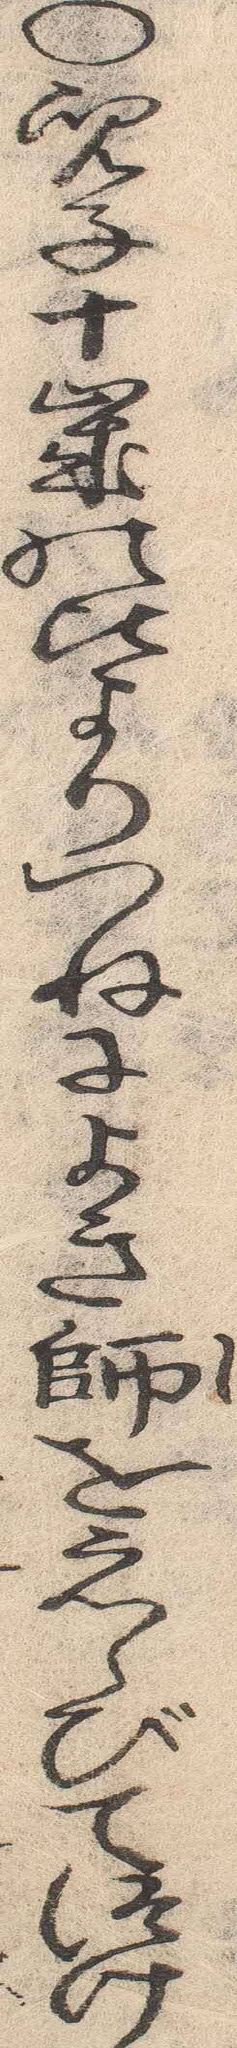○児子十歳の比よりつねによき師をえらびてつけ
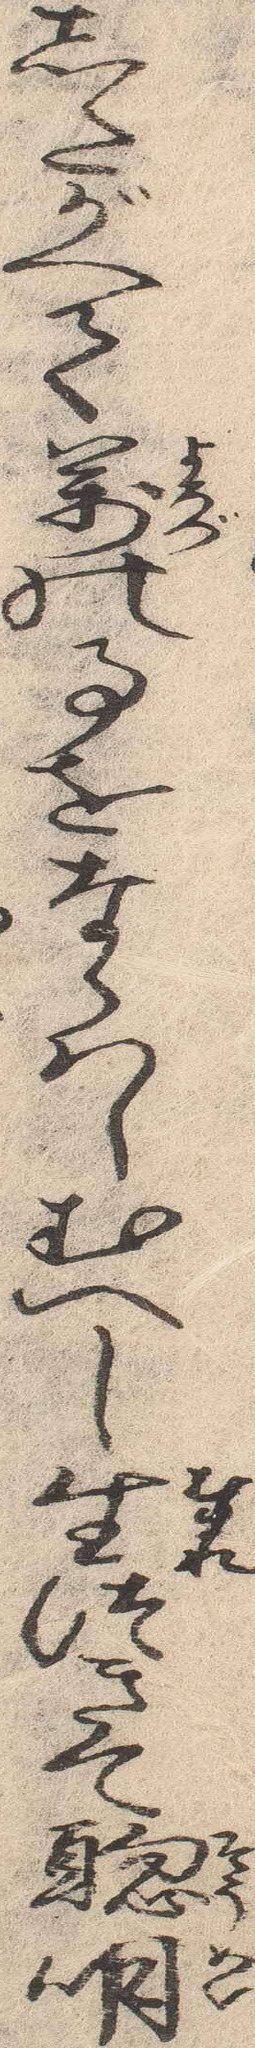したがへて万の事をならはしむへし生つきて聡明
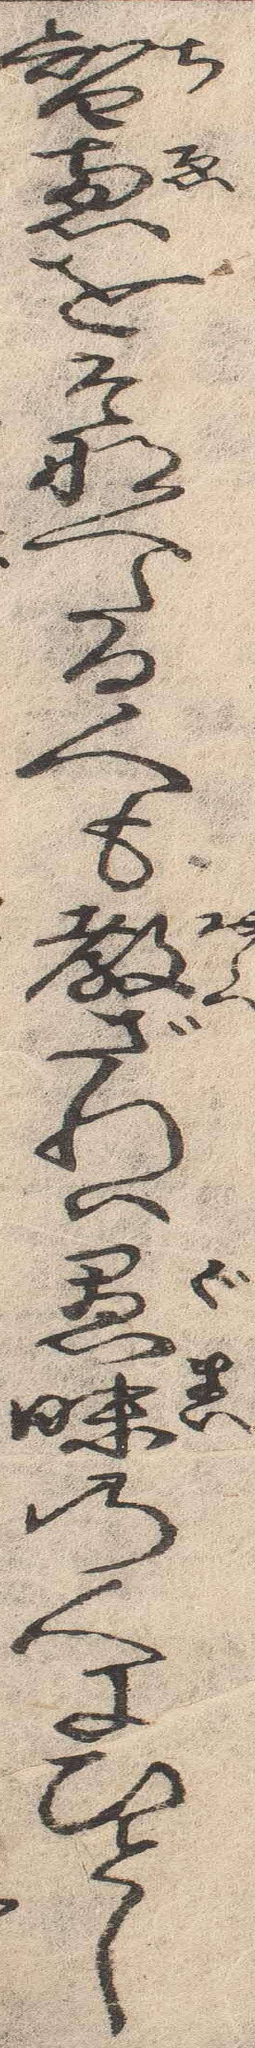智恵をそなへたる人も教ざれは愚昧の人にひとし
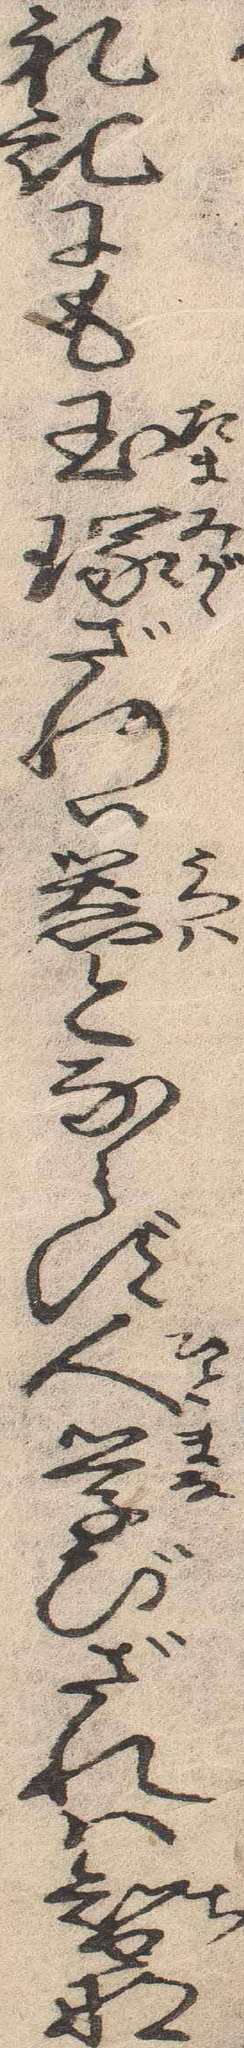礼記にも玉琢ざれは器とならず人学びざれは智な
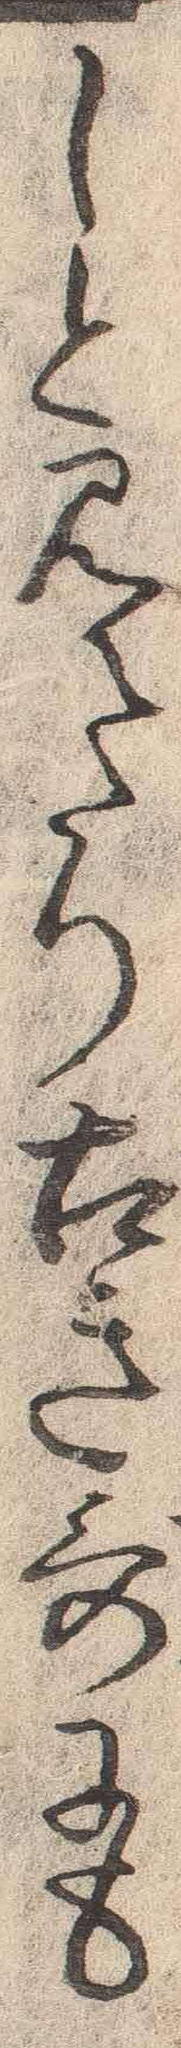しと見えたり古き哥にも
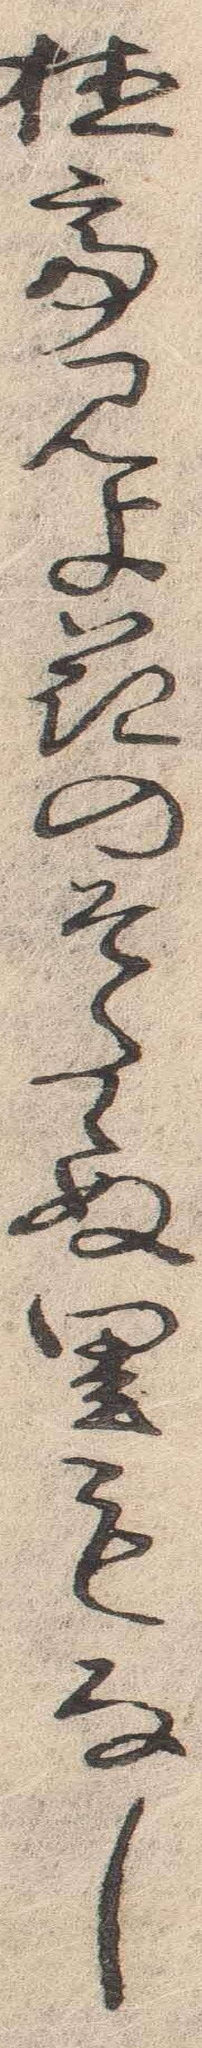植てみよ花のそたゝぬ里もなし
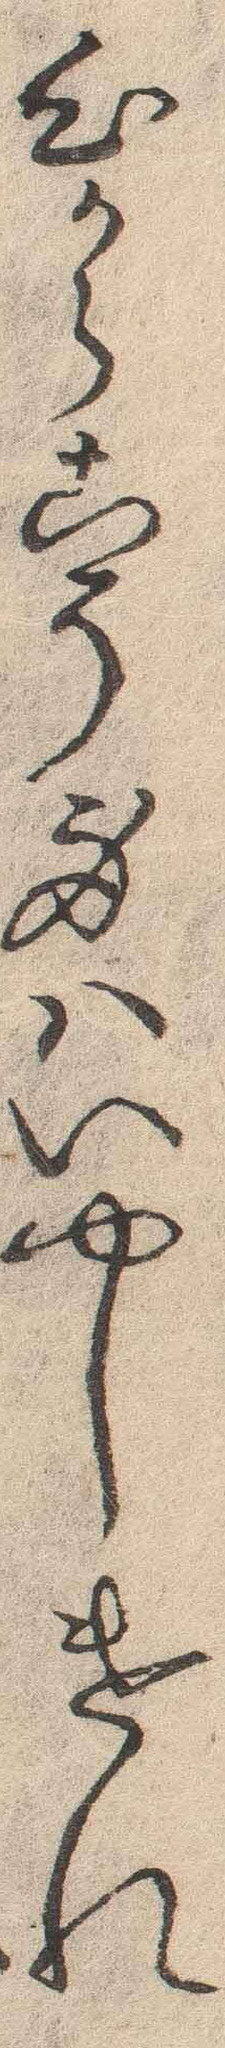心からこそ身はいやしけれ
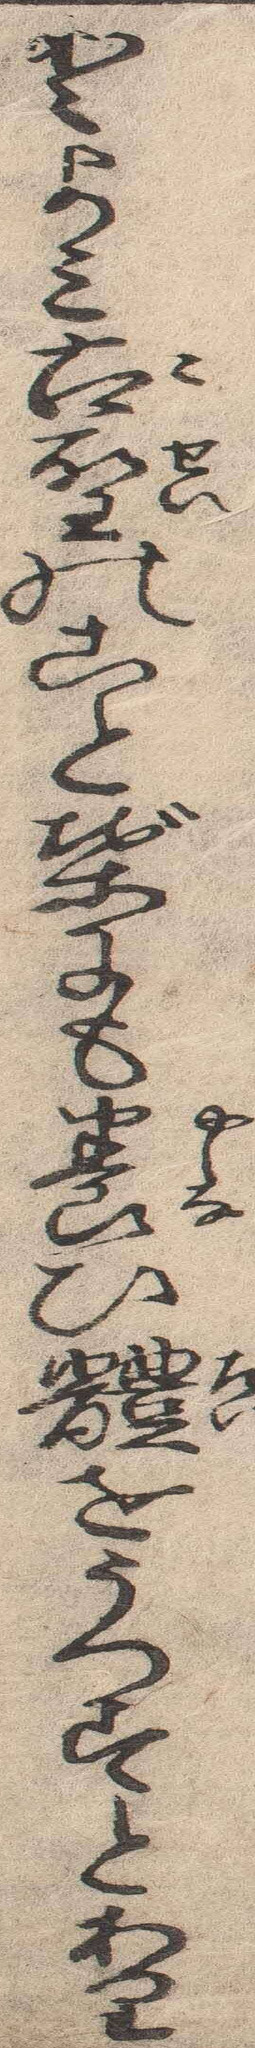とよみ古聖のことばにも養ひ体をうつすとあり
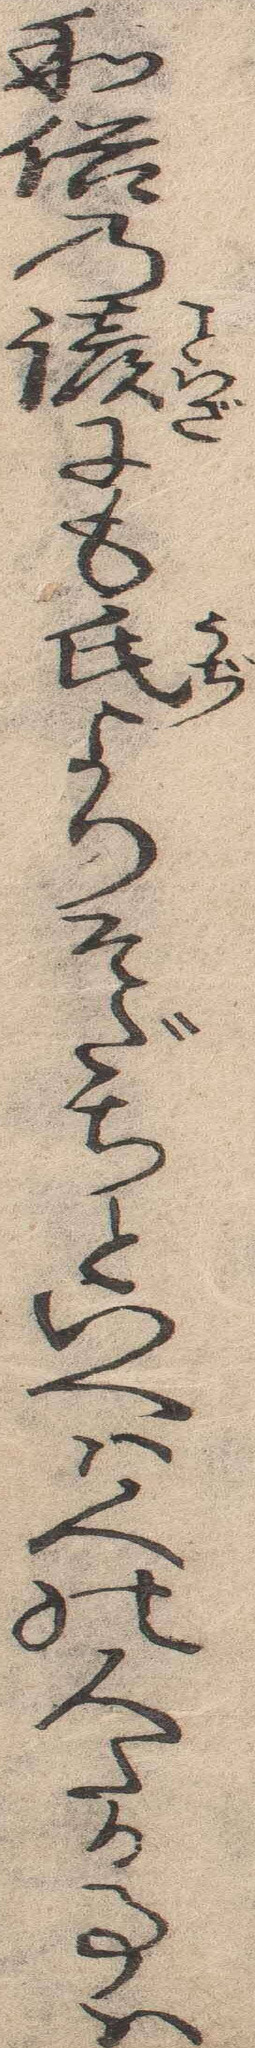和俗の諺にも氏よりそだちといへは人の人たる事は

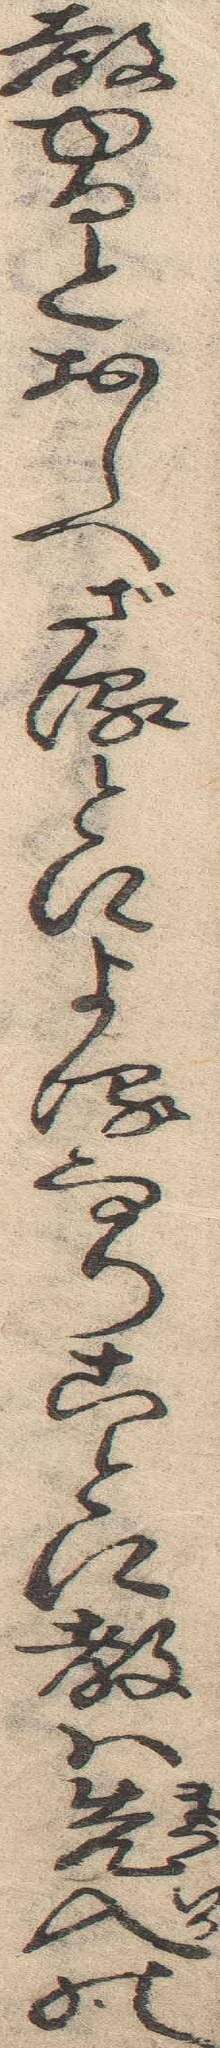教ゆるとおしへざるとによるなりことに教は先入の
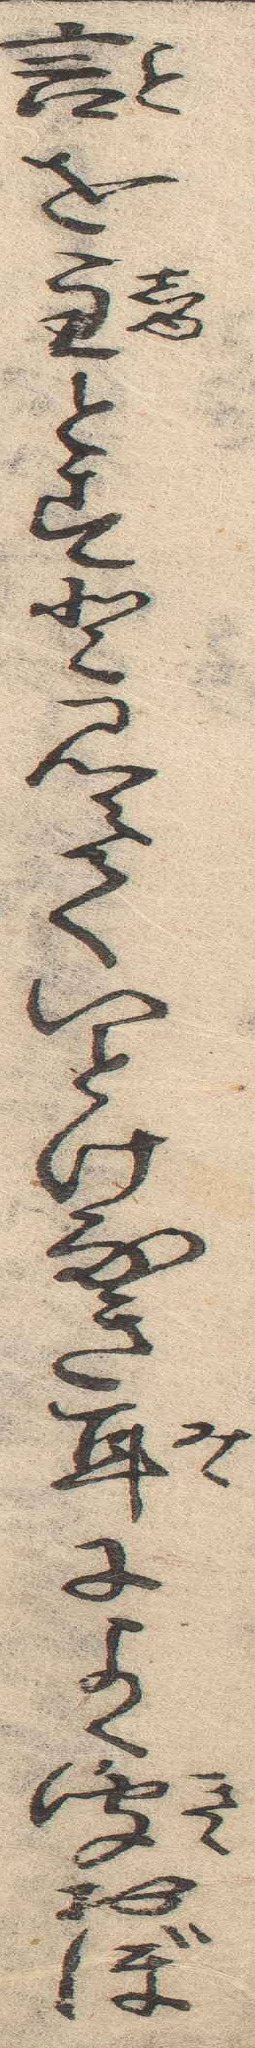言を主とすと見えていとけなき耳によく聞おぼ
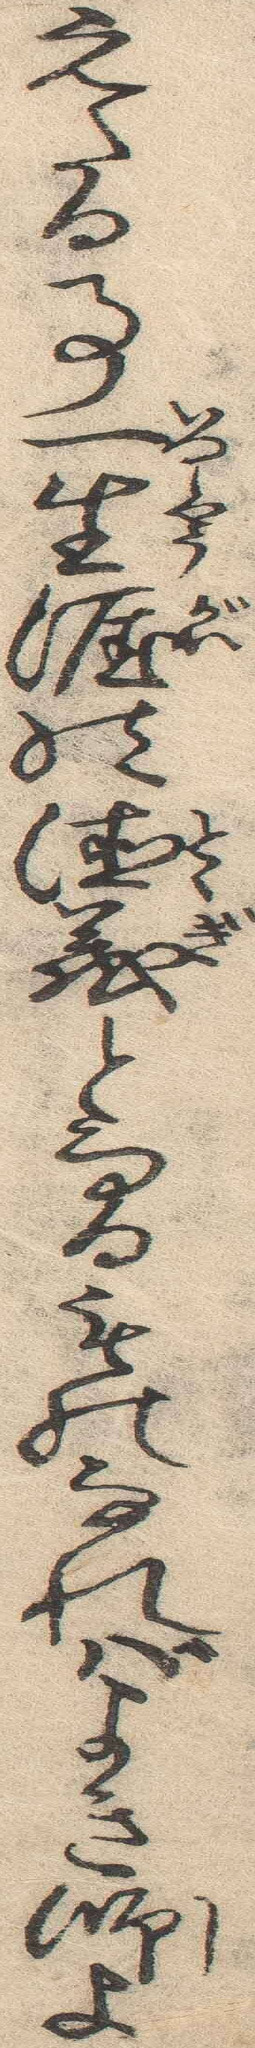えたる事一生涯の徳義となるものなればよき師よ
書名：小児必用養育草
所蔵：東京学芸大学附属図書館 国文学研究資料館
